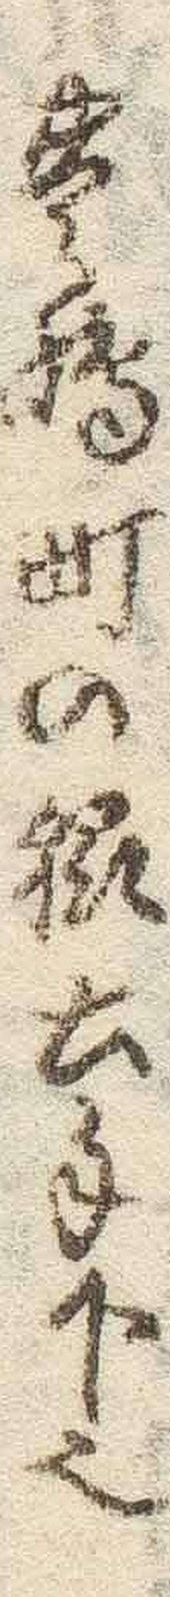豊島町の脇土手下也
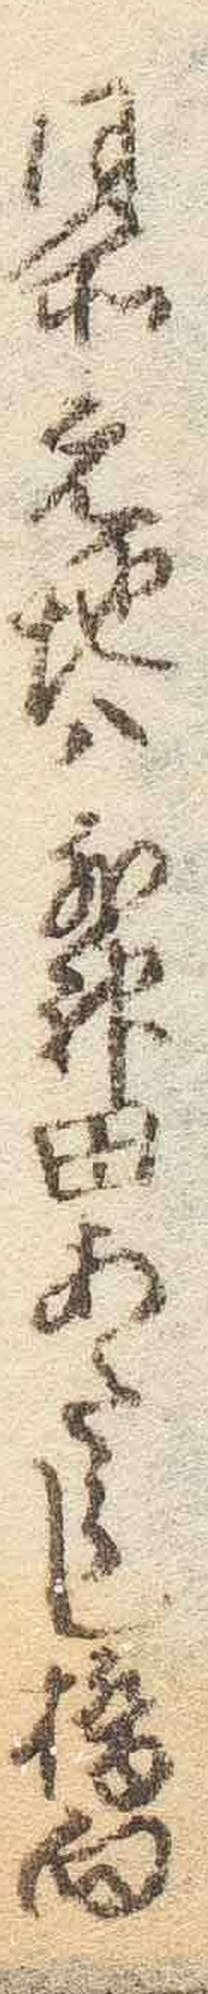同所元地は外神田あたらし橋向
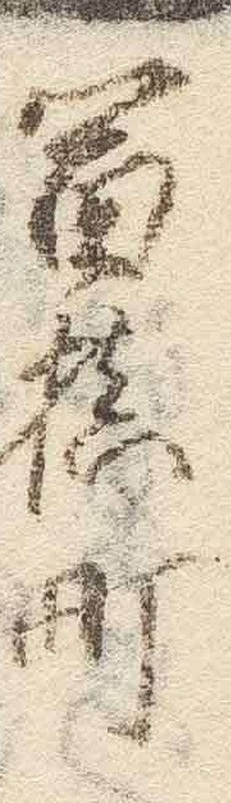富槙町
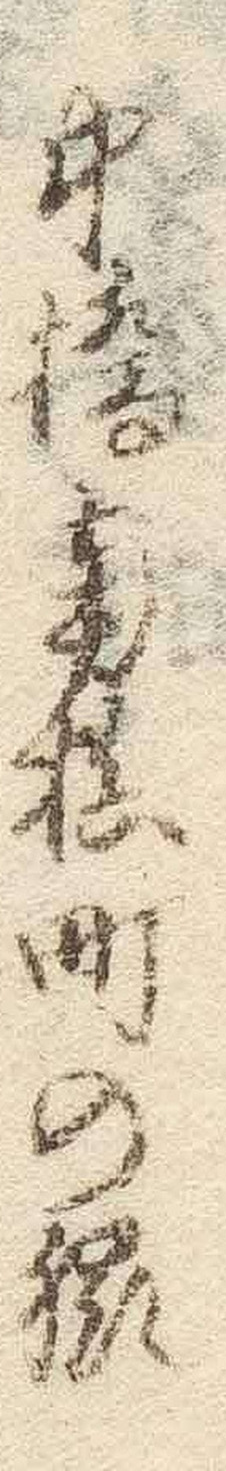中橋南槙町の脇
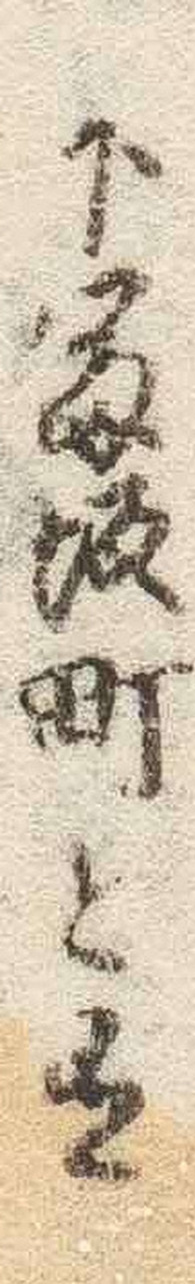下富坂町と有
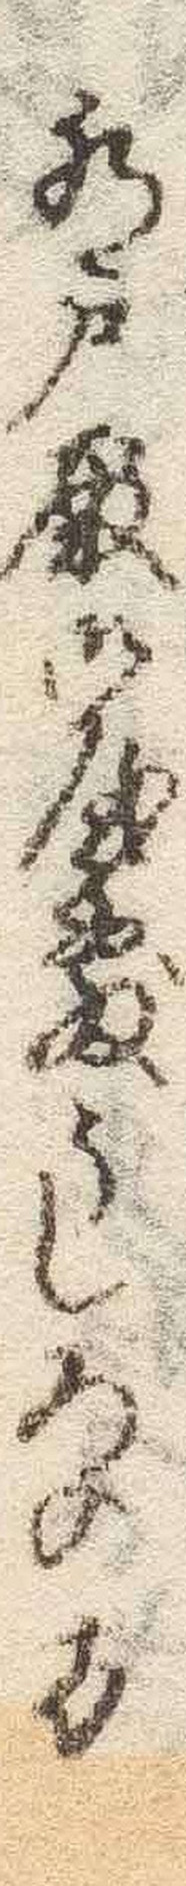水戸殿御屋敷うしろの方
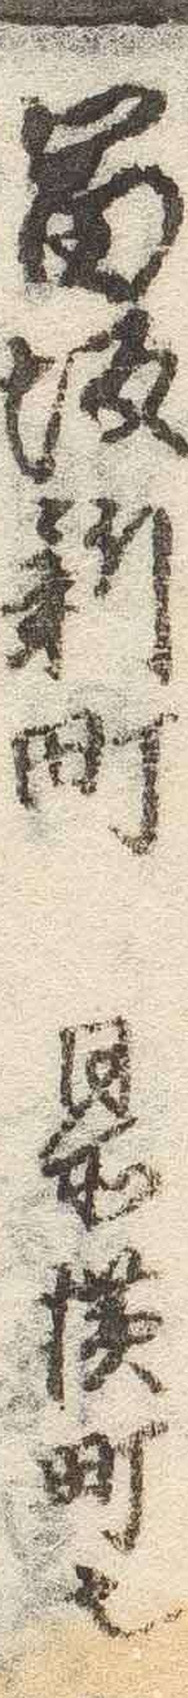富坂新町同所横町也
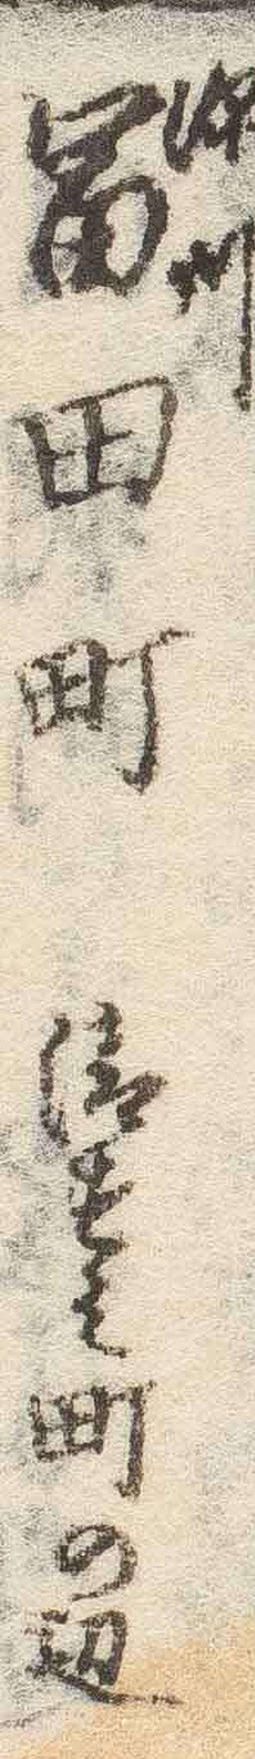富田町清すみ町の辺
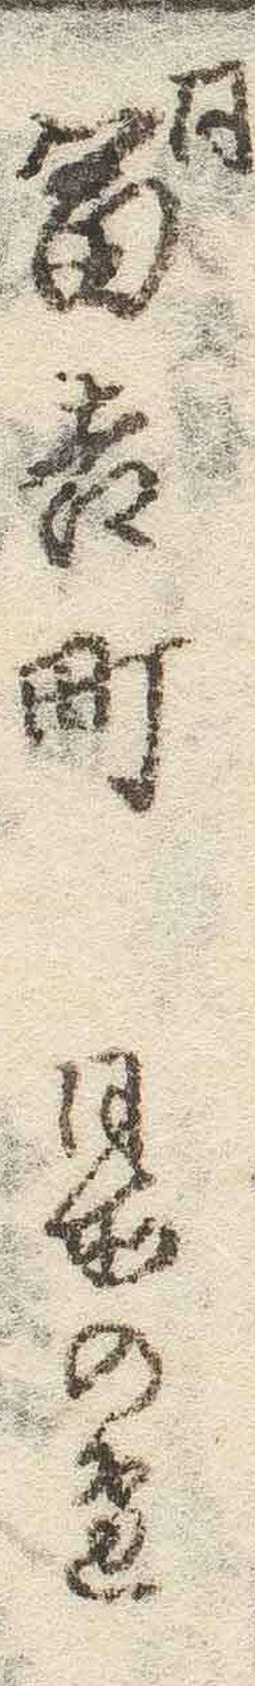富吉町同所の辺
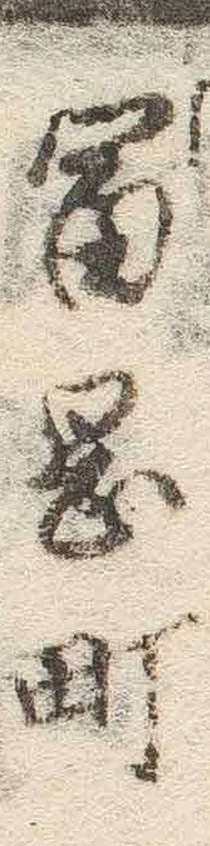豊岡町
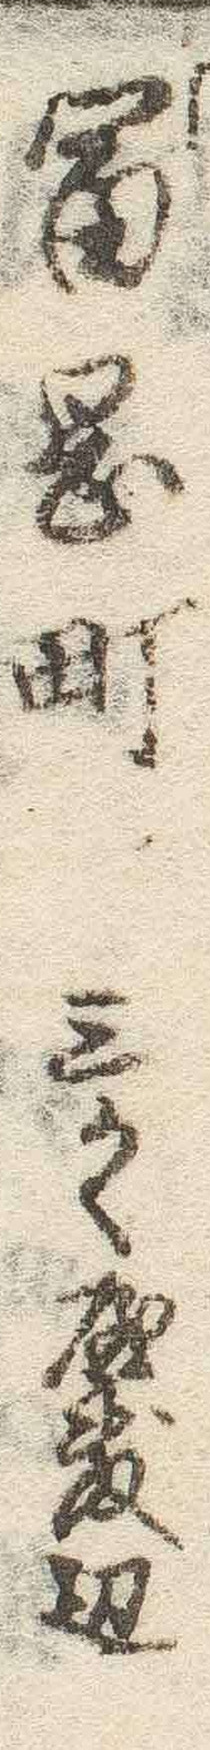富岡町三かく屋敷辺
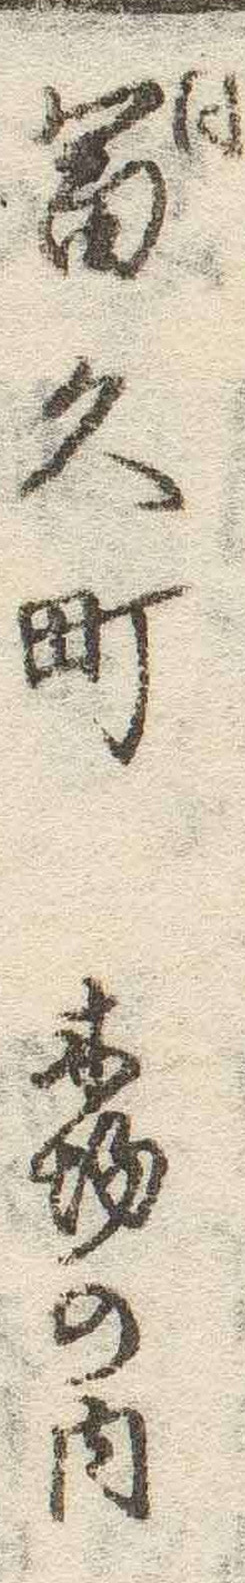富久町木場の内
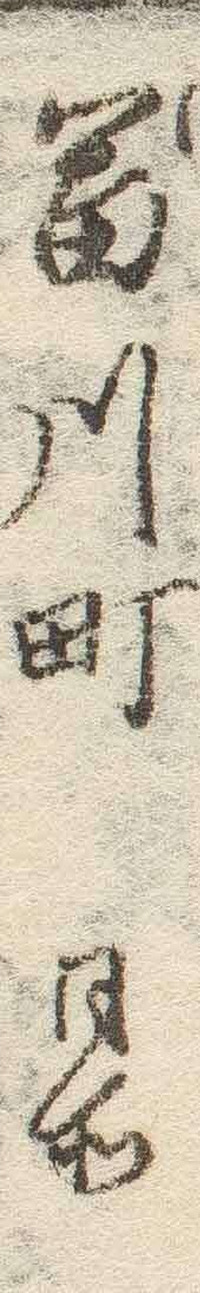富川町同所
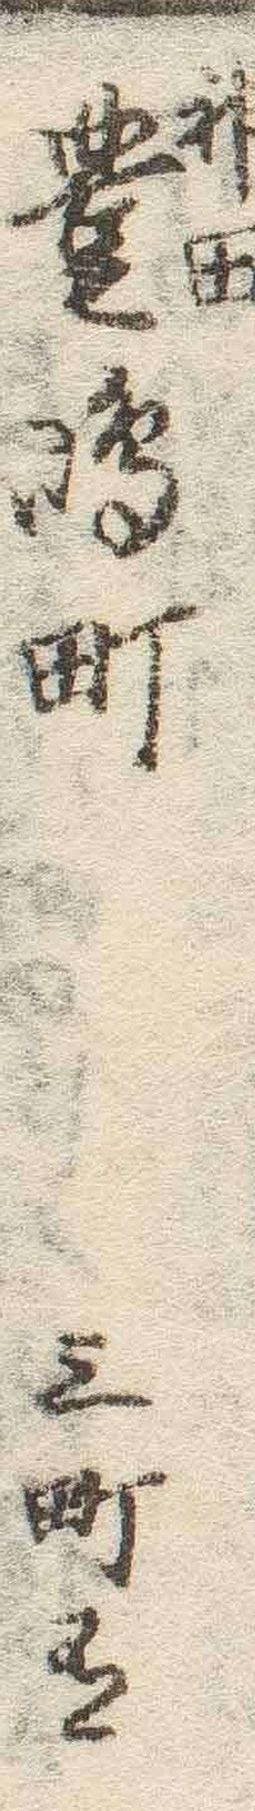豊島町三町有
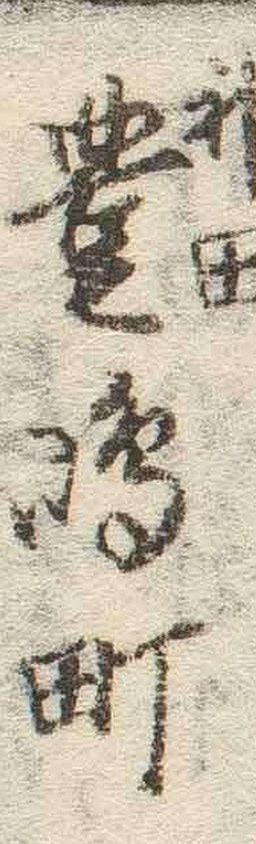豊岡町
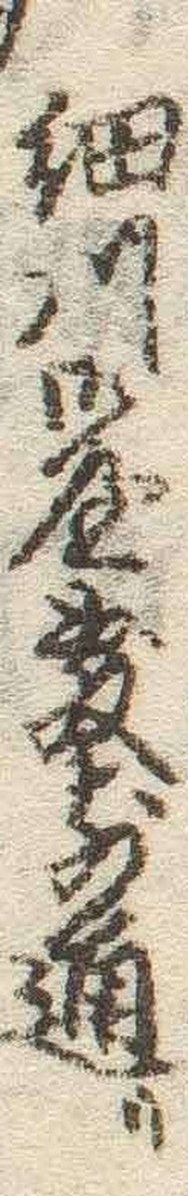細川御屋敷前通り
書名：江戸町独案内
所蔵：東京学芸大学附属図書館 国文学研究資料館
